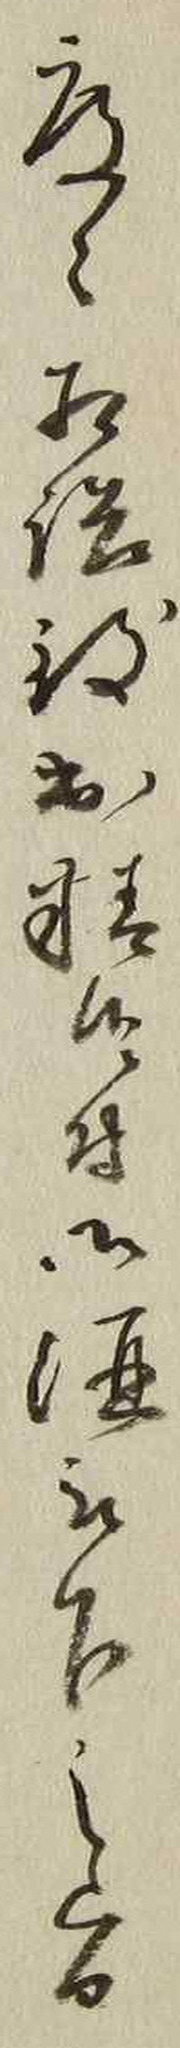度々相詰致出精候ニ付御酒被下之旨
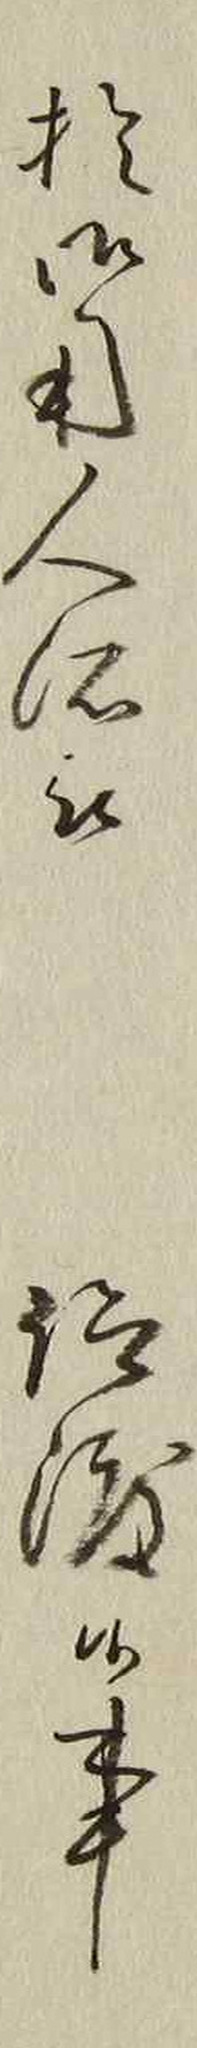於御用人所被仰渡候事
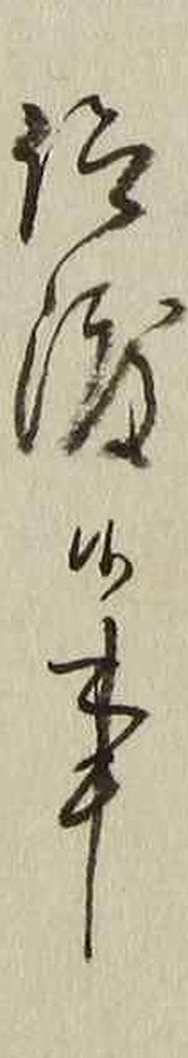仰付候事
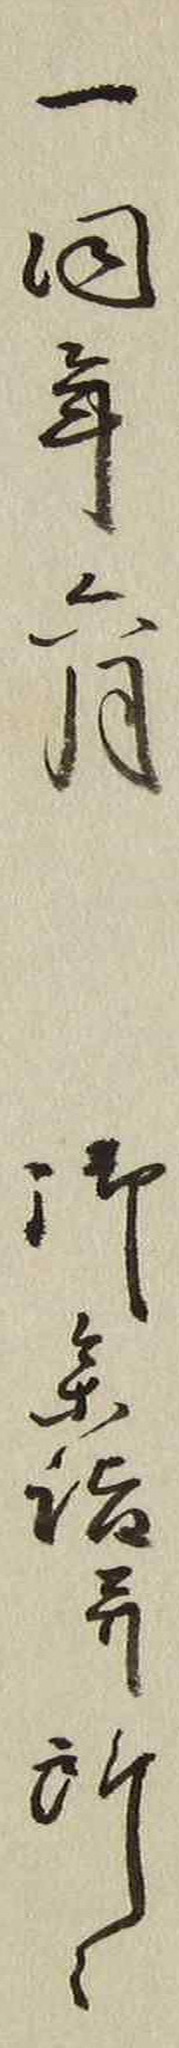一同年六月御参詣并所々
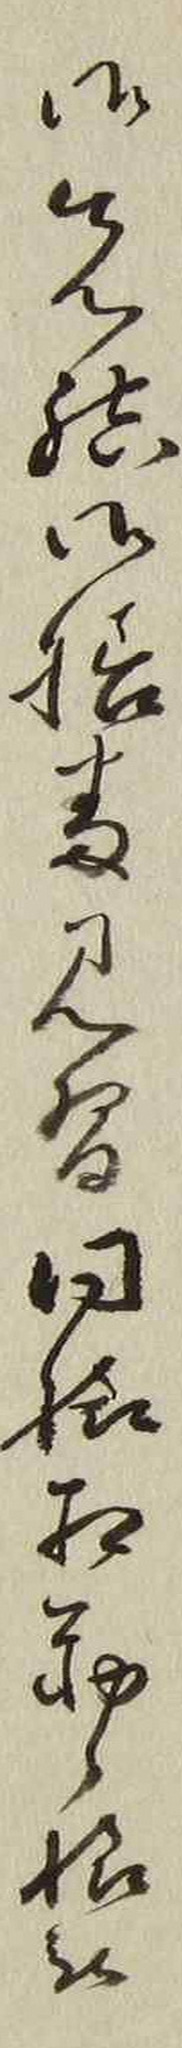御先詰御膳番見習同様相勤候様被
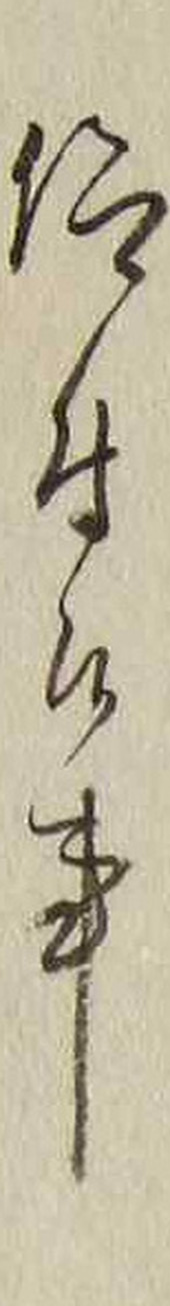仰付候事
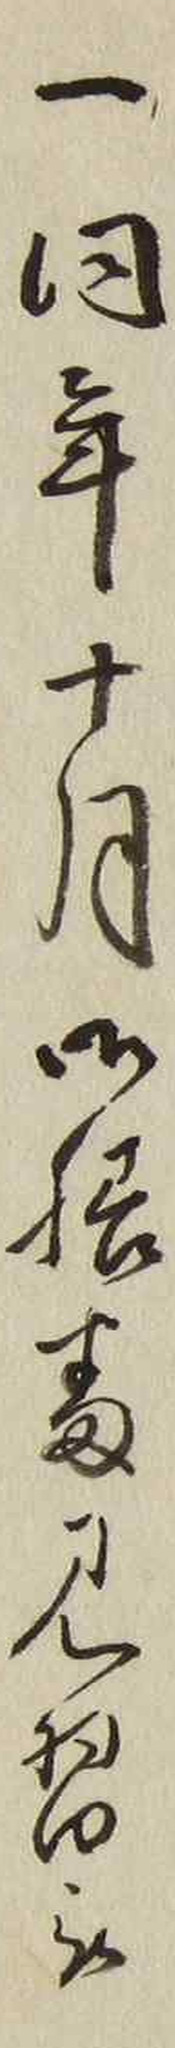一同年十月御膳番見習被

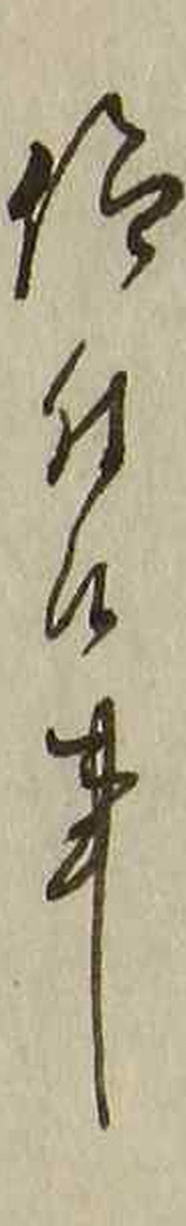仰付候事
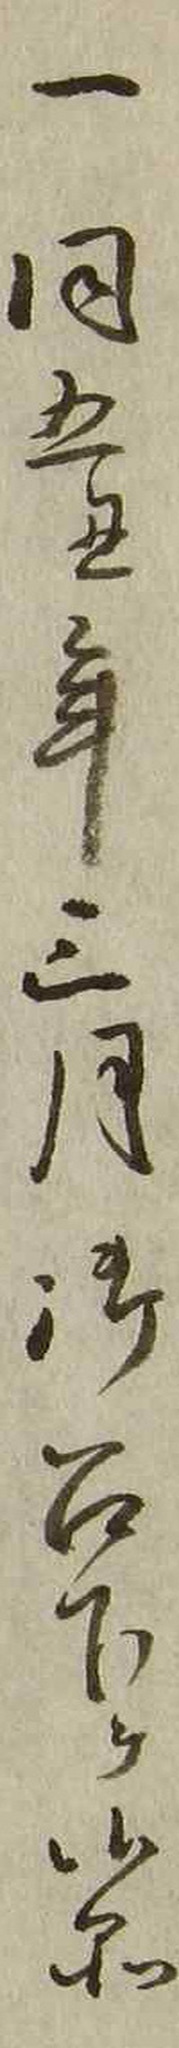一同五丑年三月御召下ケ弐品
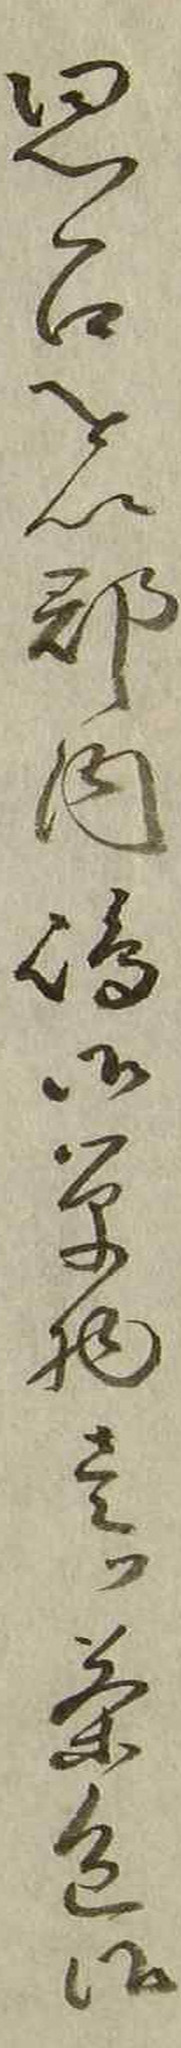思召を以郡内嶋御単物壱ツ茶色御
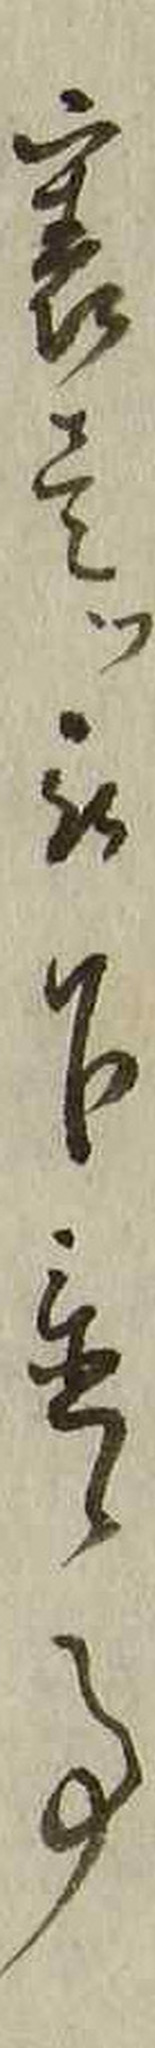裏壱ツ被下置候事
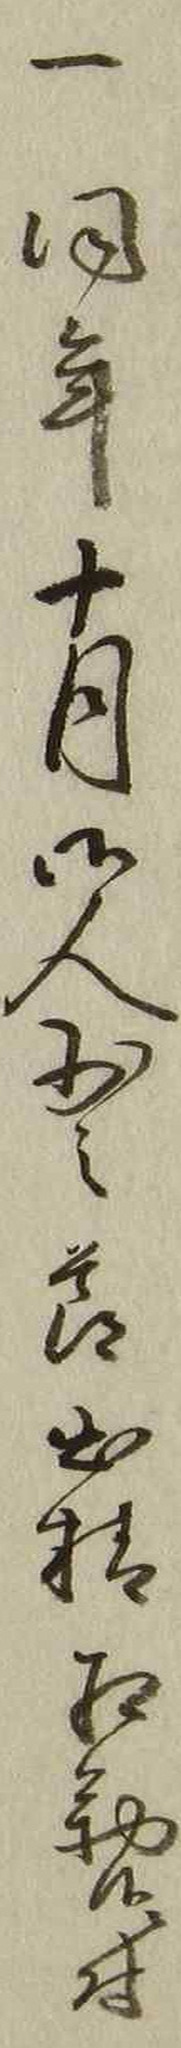一同年十月御人少之節出精相勤候ニ付
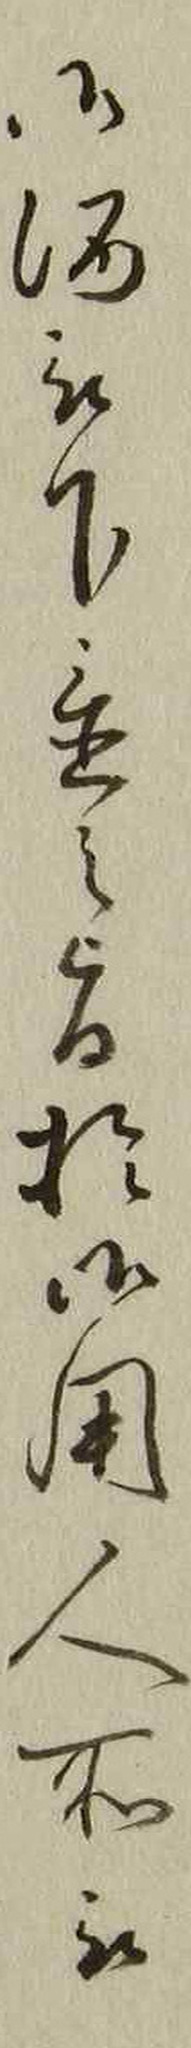御酒被下置之旨於御用人所被
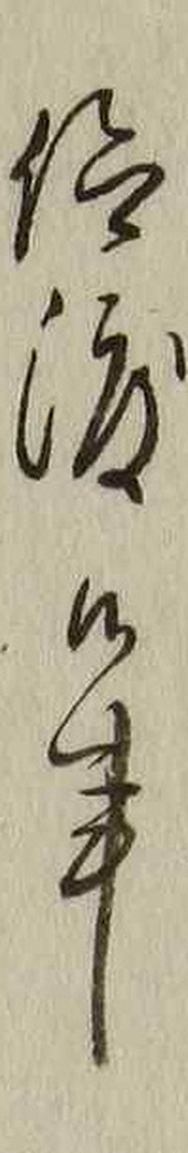仰渡候事
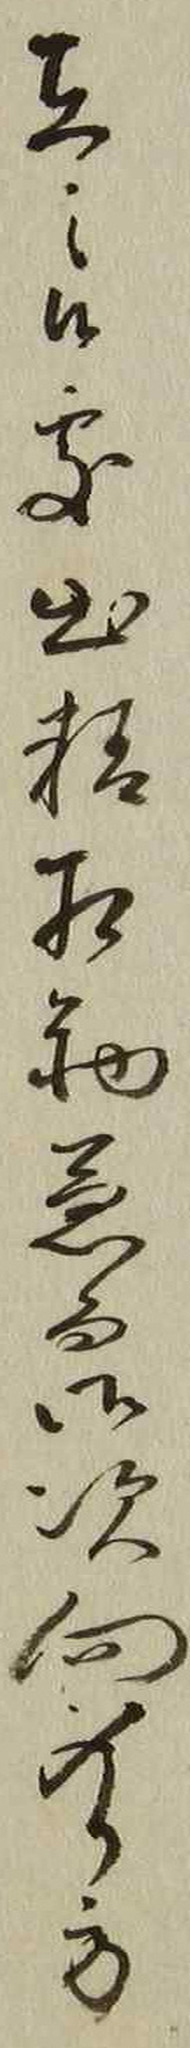在之候処出精相勤兼而御次向〆り方
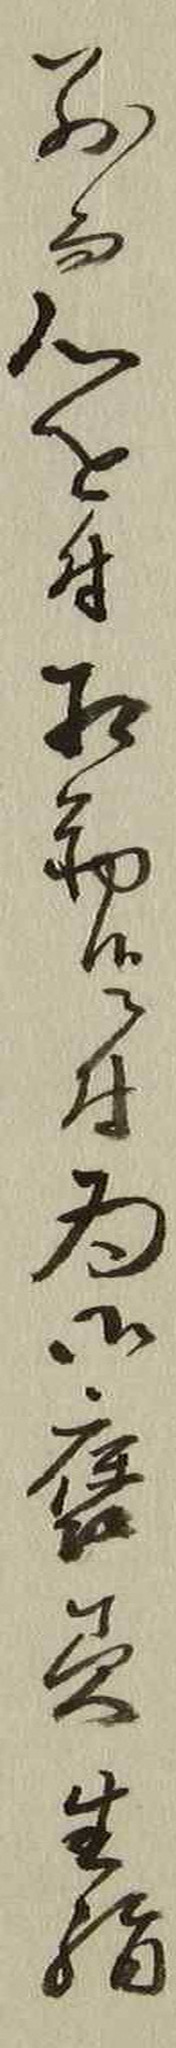別而心を付相勤候ニ付為御褒美生絹
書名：諸士系譜　巻之4　い之部4
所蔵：会津若松市立会津図書館
